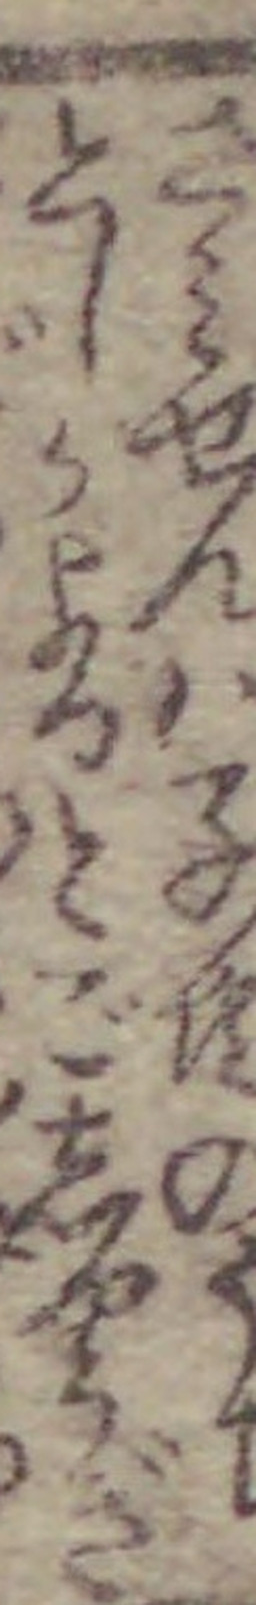としかよるとごしやうぎ
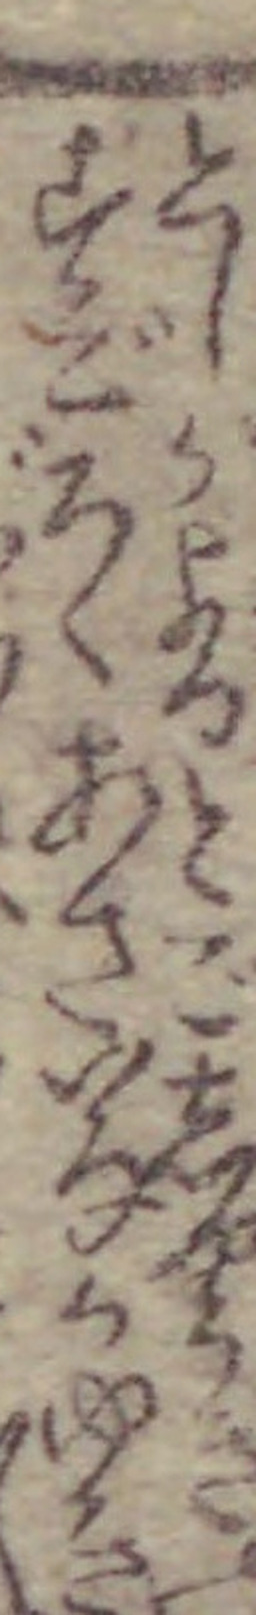すごろくあさいなかゆき
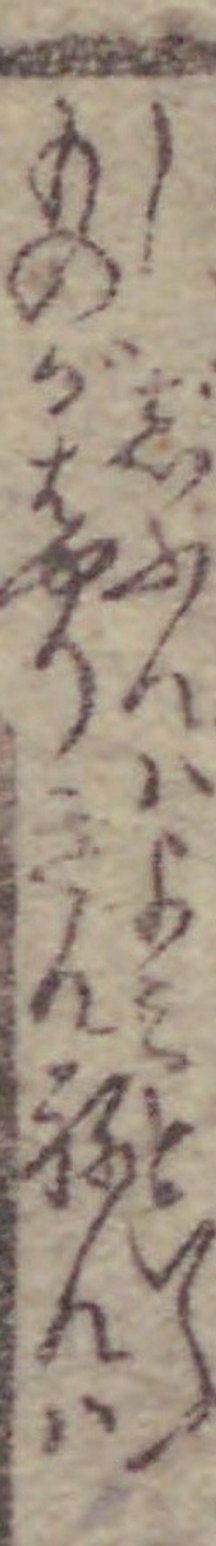ものがはやりきんねんは
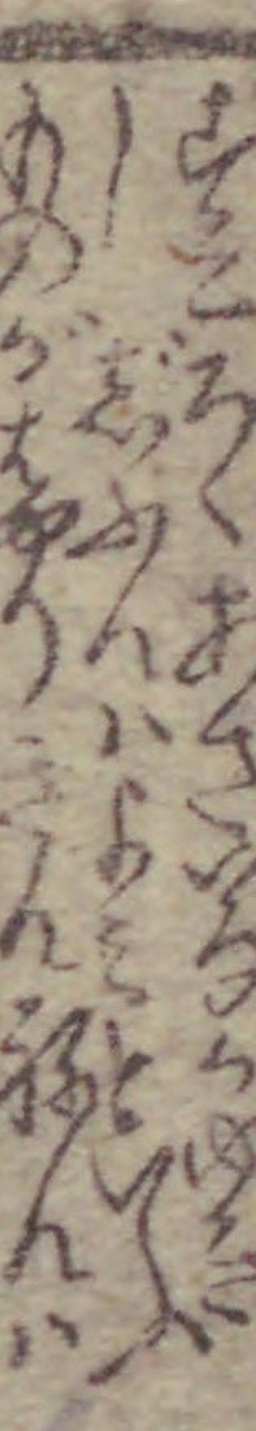ものがはやりきんねんは
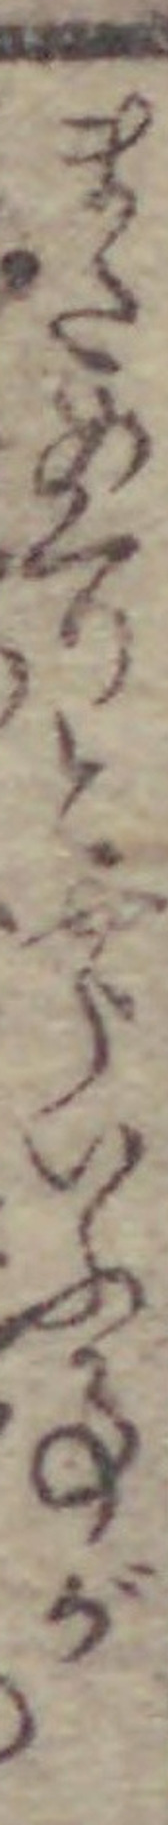まためくりとやらいふ事が
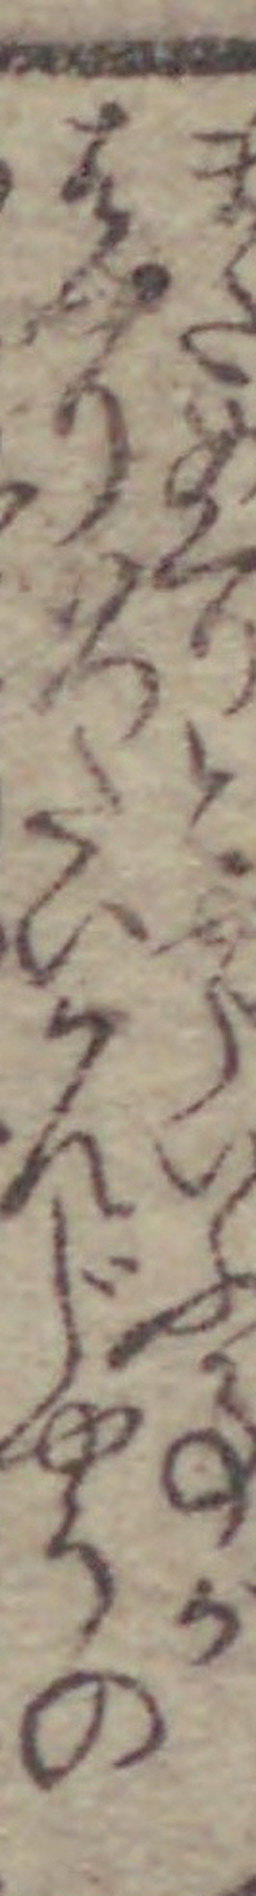はやりいつたいかんじやうの
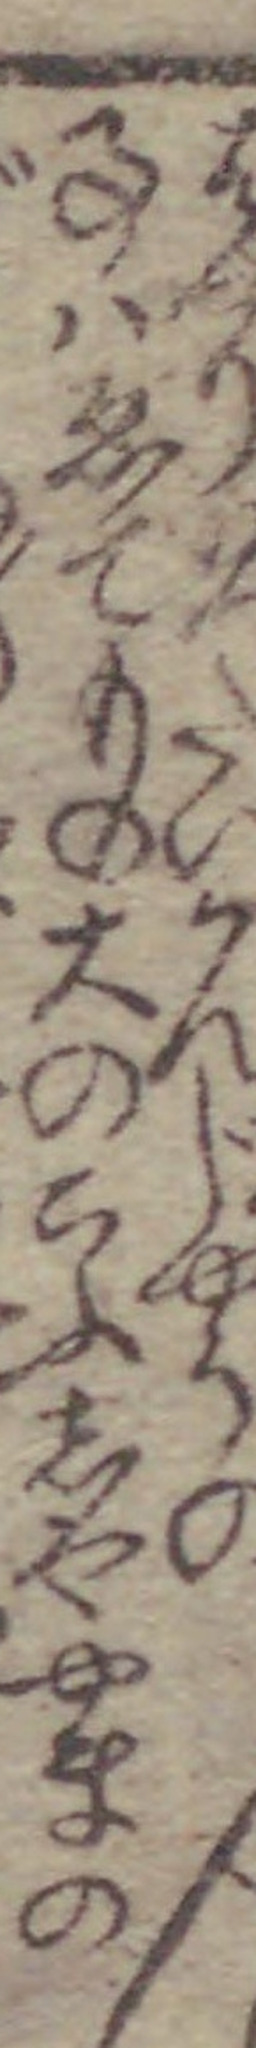事はゑてもの大のこふしややまの
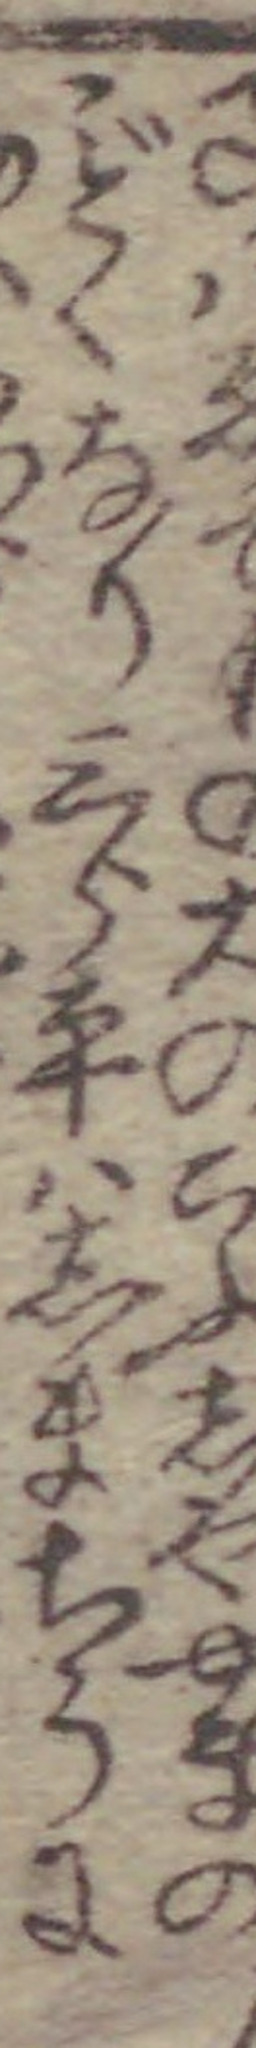ごとくなり三郎平はしまちうに
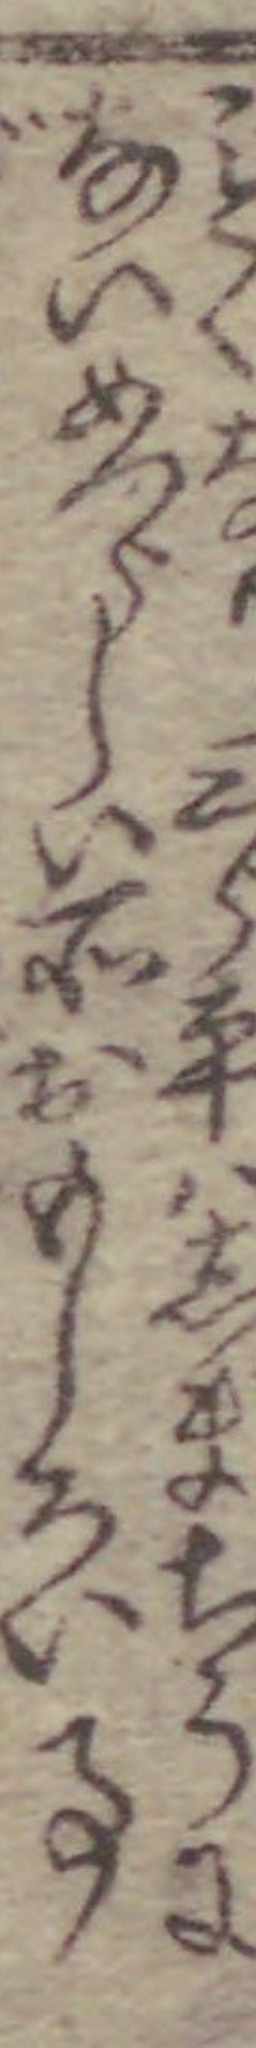ないめつらしい所おもしろい事
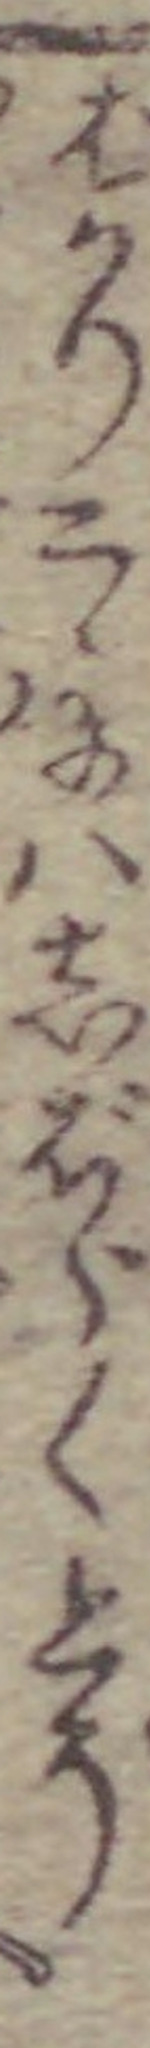ばかりこゝにはしばらくとう
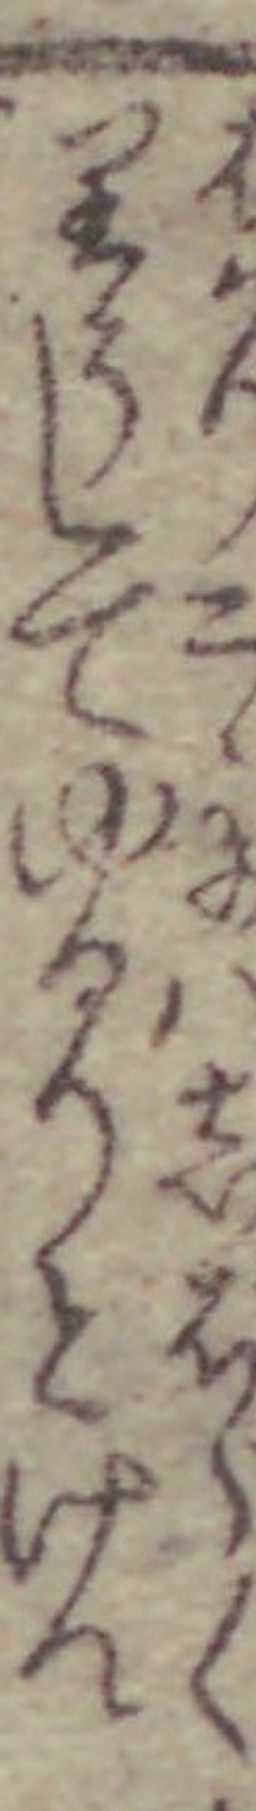りうしてゆるりとけん
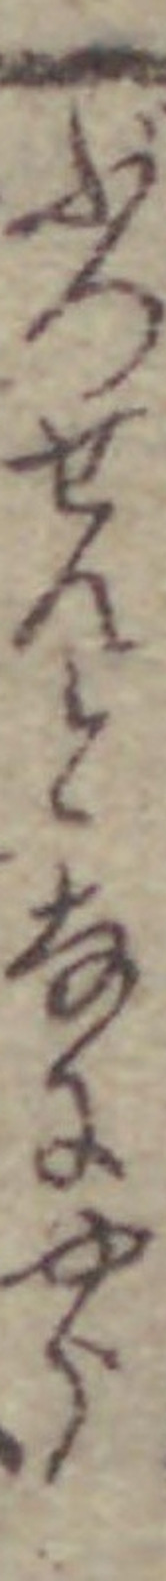ぶつせんとなにやら
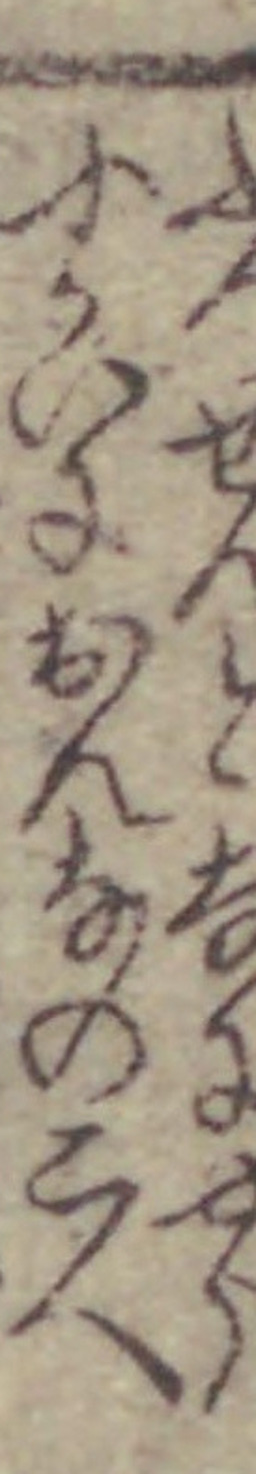にかいにおんなのこへ
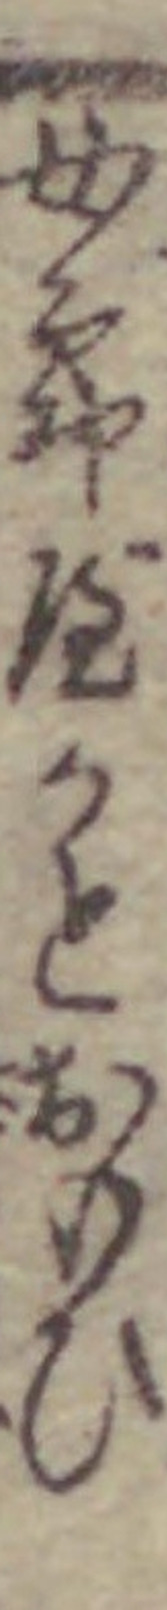女郎屋かとおもひ
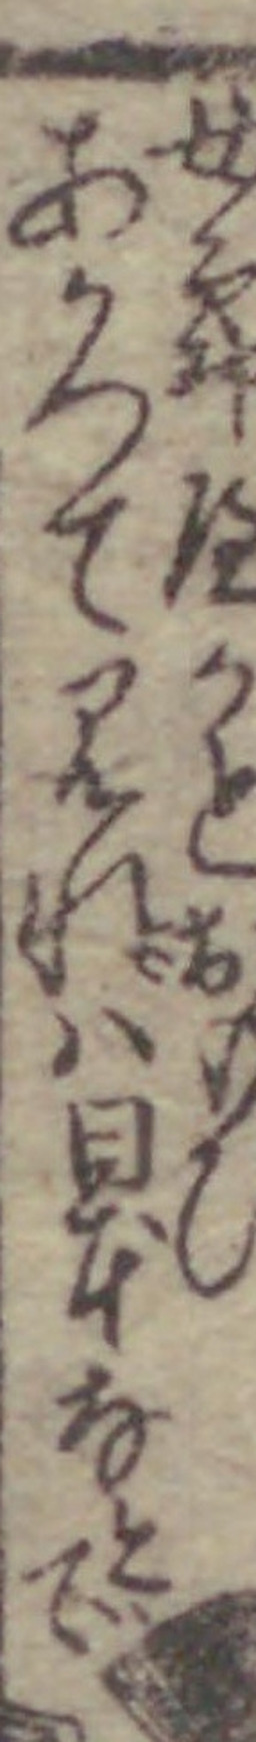あかつてみれば日本なとで
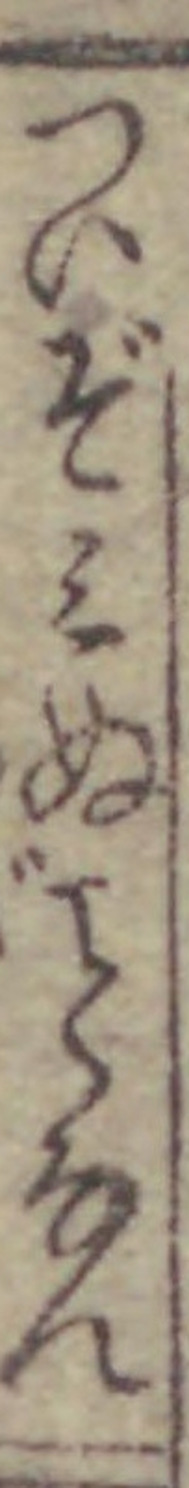ついぞみぬことなん
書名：近頃嶋めぐり 3巻
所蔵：国立国会図書館 National Diet Library, JAPAN
